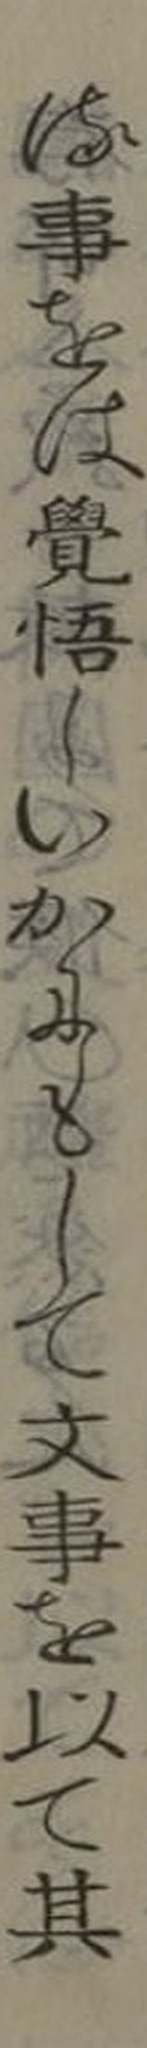る事をは覺悟しいかにもして文事を以て其
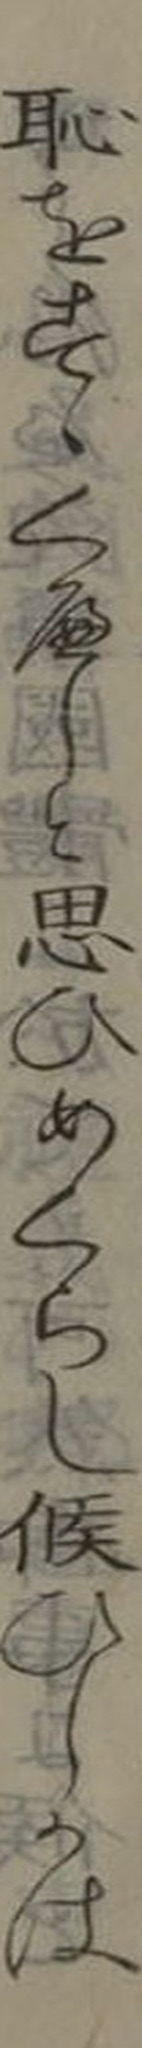恥をすゝくへしと思ひめくらし候ひしかは
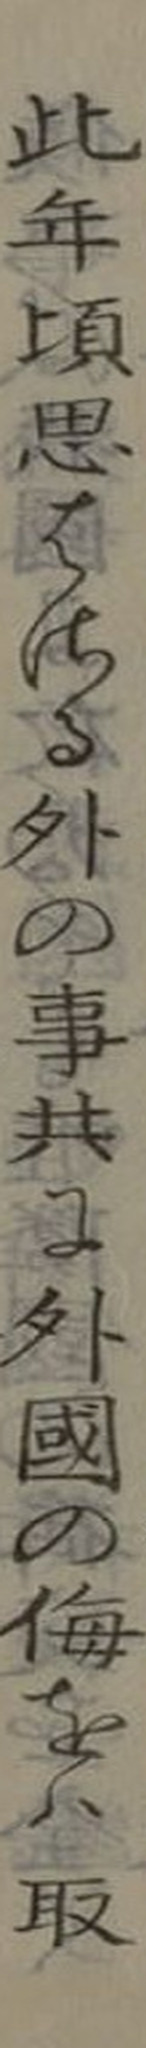此年頃思はるる外の事共に外國の侮をは取
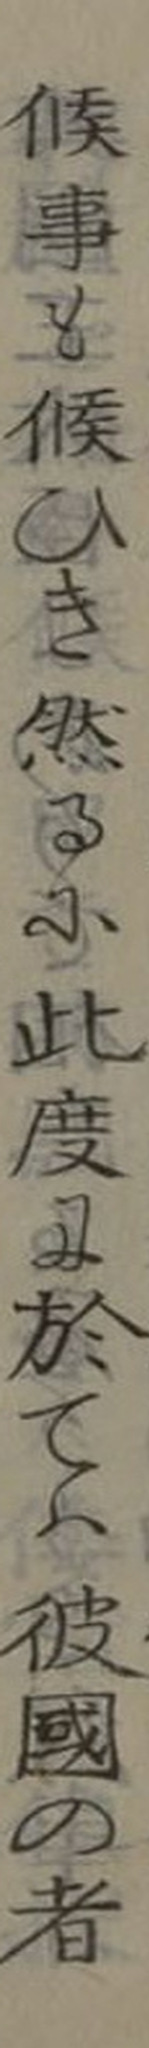候事も候ひき然るに此度に於ては彼國の者
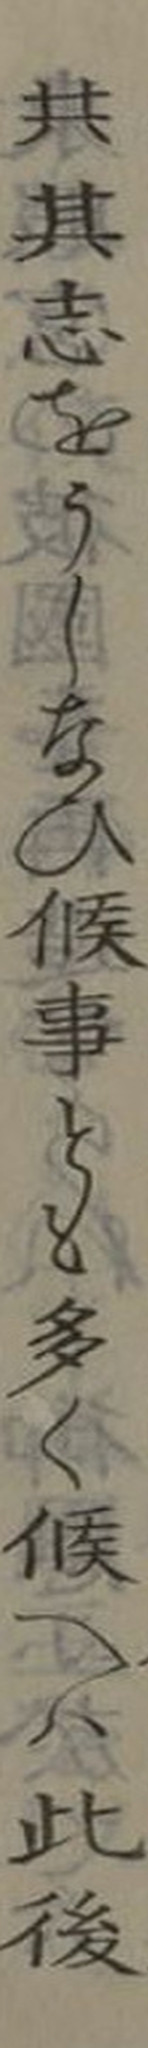共其志をうしなひ候事とも多く候へは此後
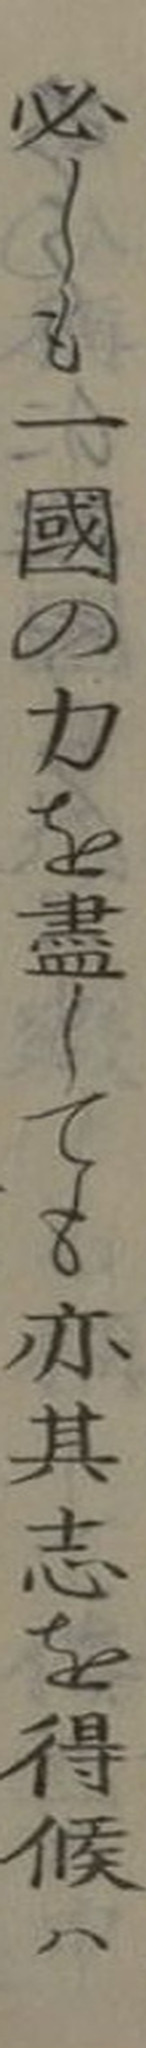必しも一國の力を盡しても亦其志を得候は
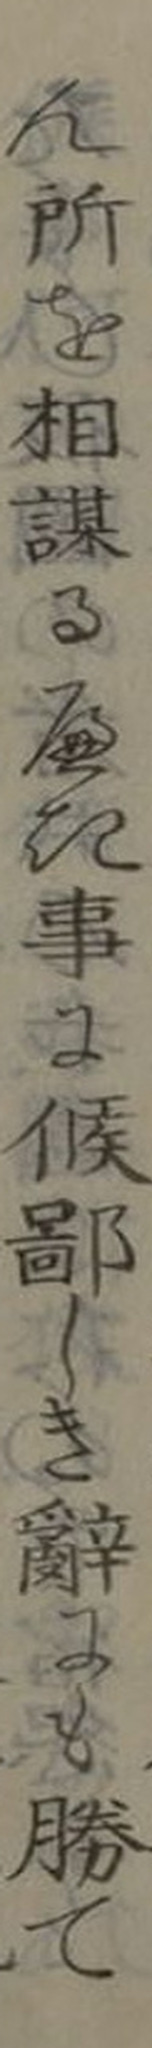ん所を相謀るへき事に候鄙しき辭にも勝て
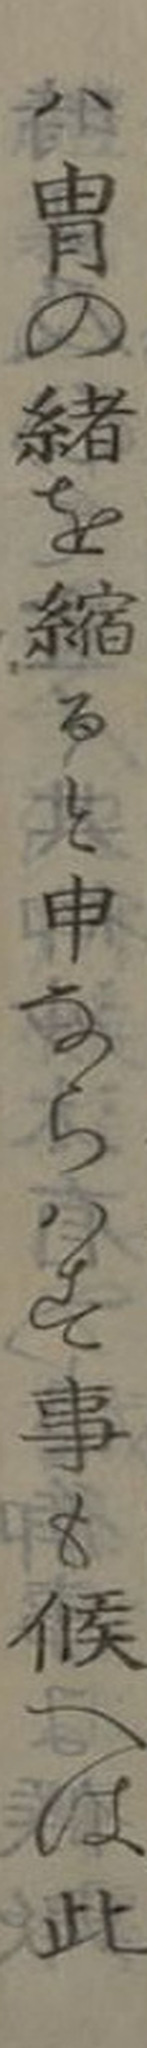は冑の緒を縮ると申ならはす事も候へは此

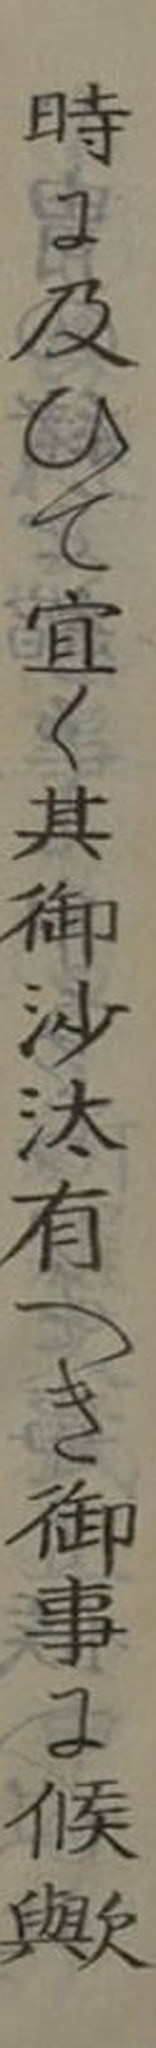時に及ひて宜く其御沙汰有へき御事に候歟
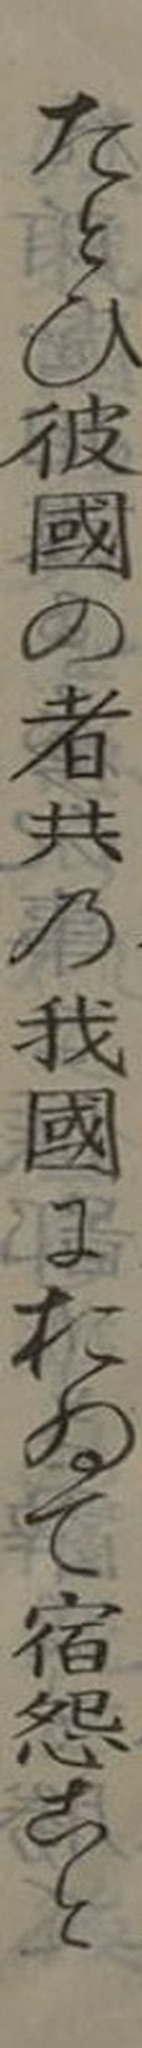たとひ彼國の者共の我國におゐて宿怨こと
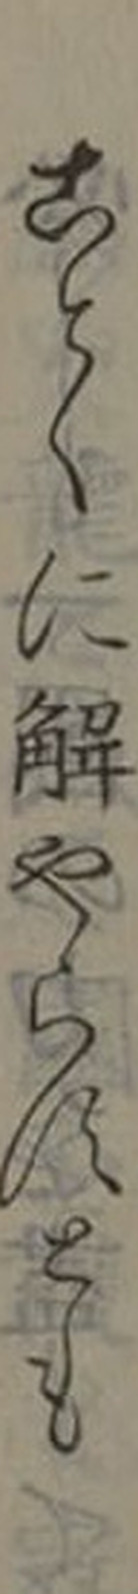ことくに解やらすとも
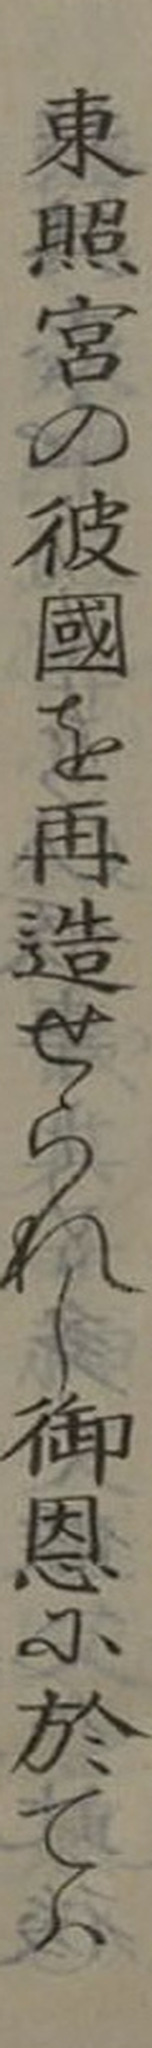東照宮の彼國を再造せられし御恩に於ては
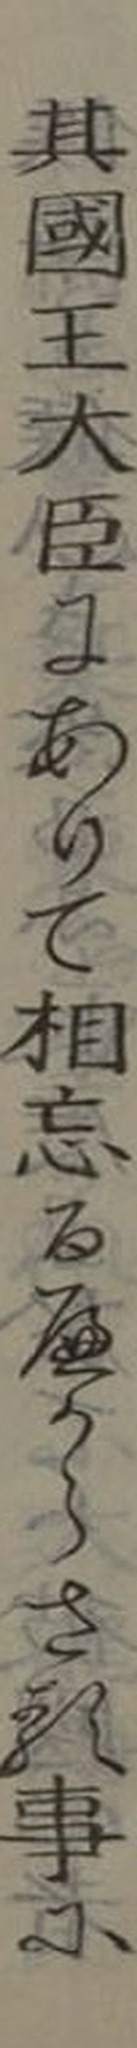其國王大臣にありて相忘るへからさる事に
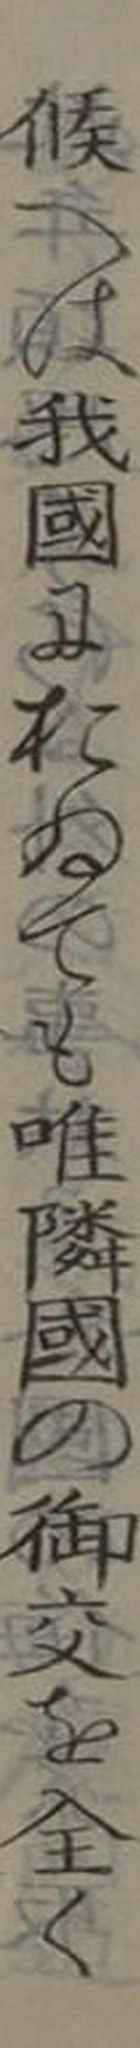候へは我國におゐても唯隣國の御交を全く
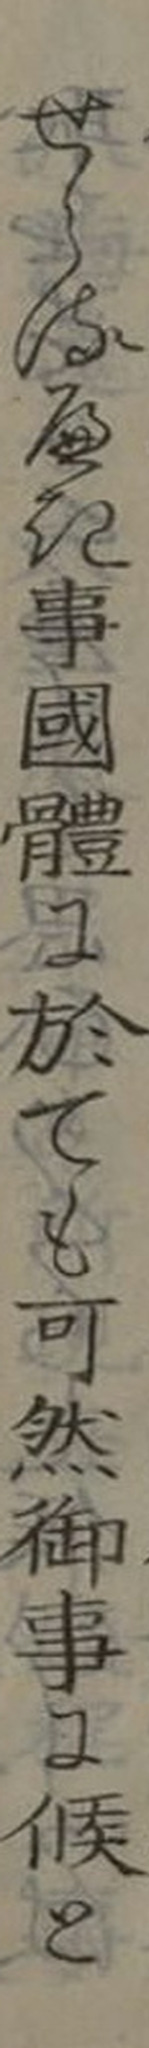せらるへき事國體に於ても可然御事に候と
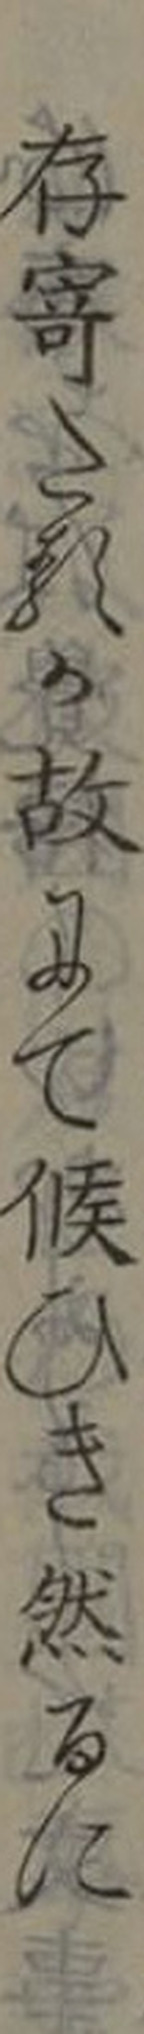存寄たる故にて候ひき然るに
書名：骨董録
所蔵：University of the Ryukyus Library
